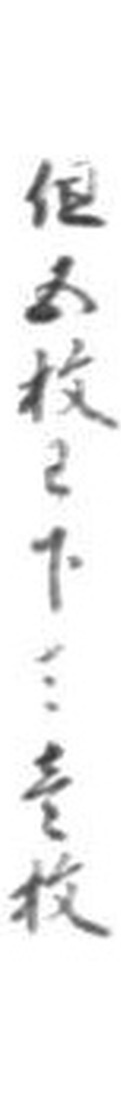但五枚已下者壱枚

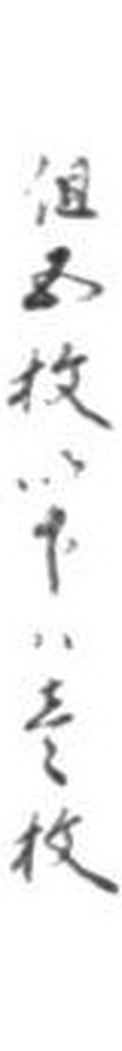但五枚以下ハ壱枚
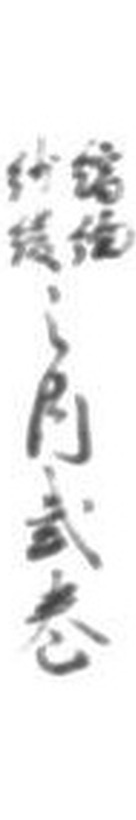紗綾之内弐巻

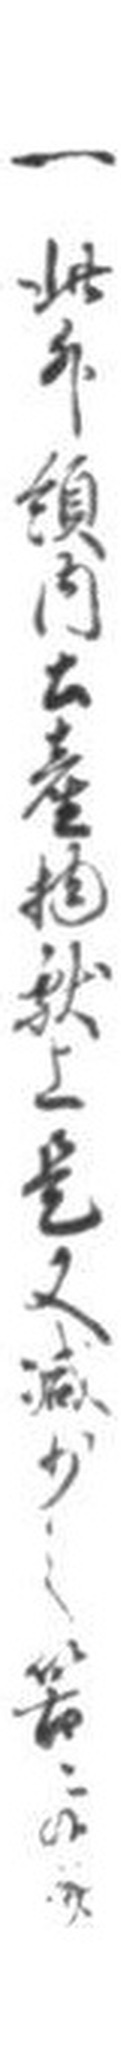一此外領内土産物献上是又減少之筈ニ候并
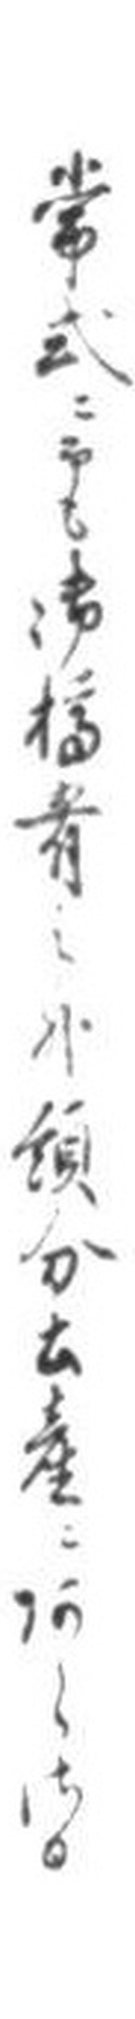常式ニ而も御樽肴之外領分土産ニあらさる
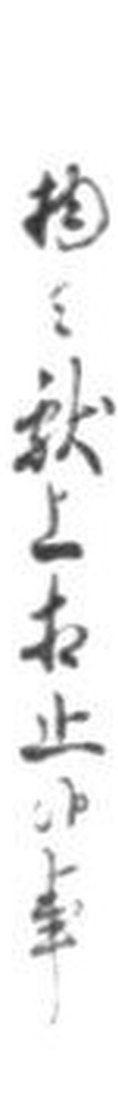物者献上相止候事
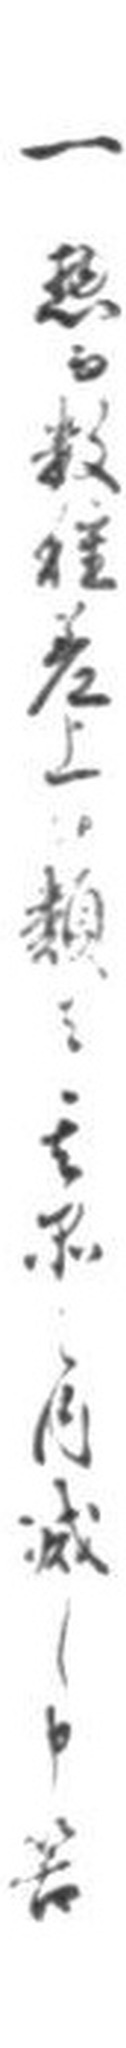一惣而数種差上候類者其品之内減し申筈
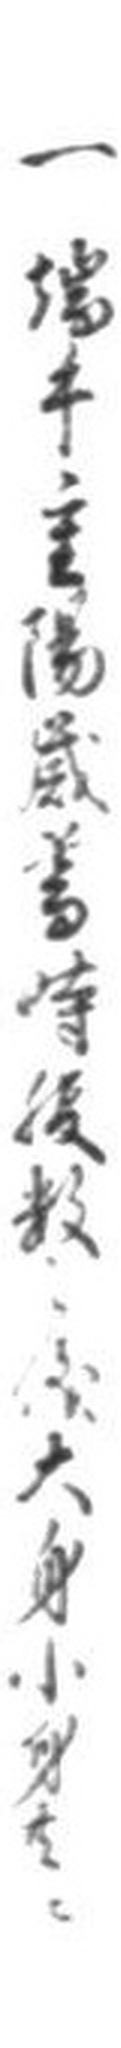一端午重陽歳暮時服数之儀大身小身共ニ
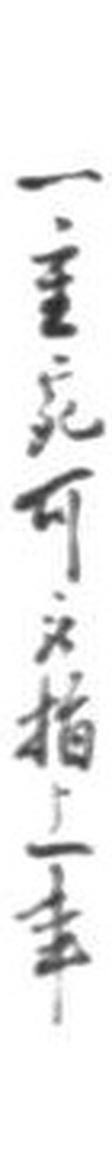一重宛可被指上事
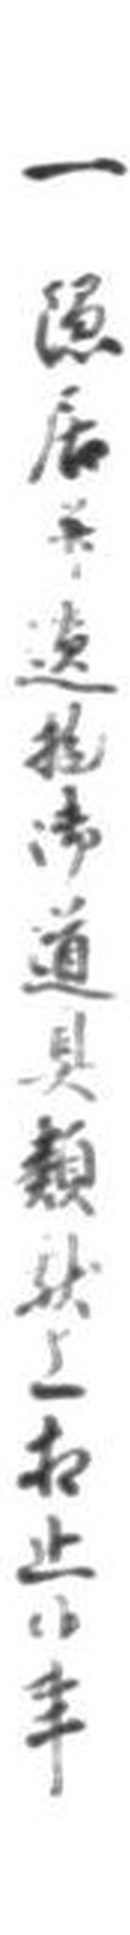一隠居并遺物御道具類献上相止候事
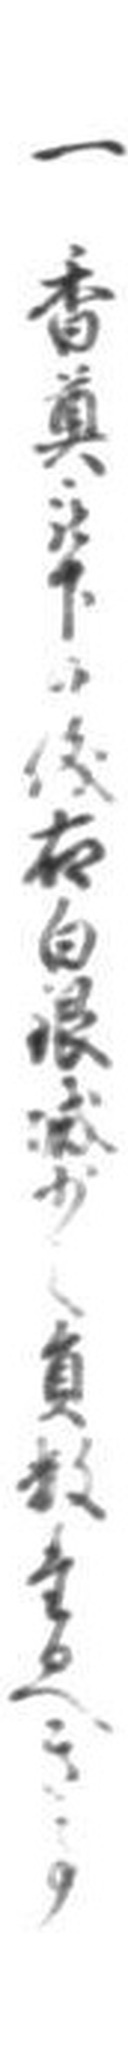一香奠被下候儀右白銀減少之員数たるへき事
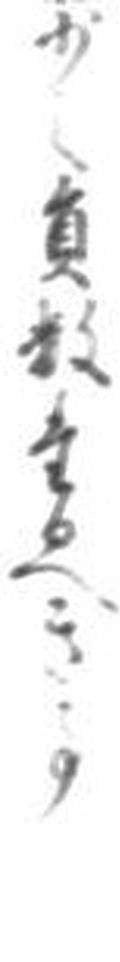之通たるへき事
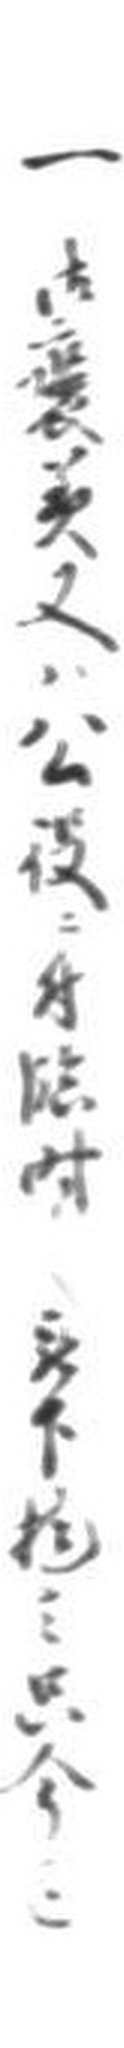一御褒美又ハ公役ニ付臨時之被下物者只今迄
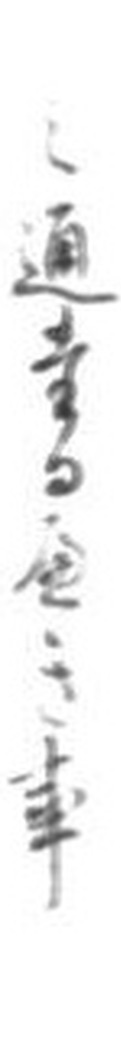之通たるへき事
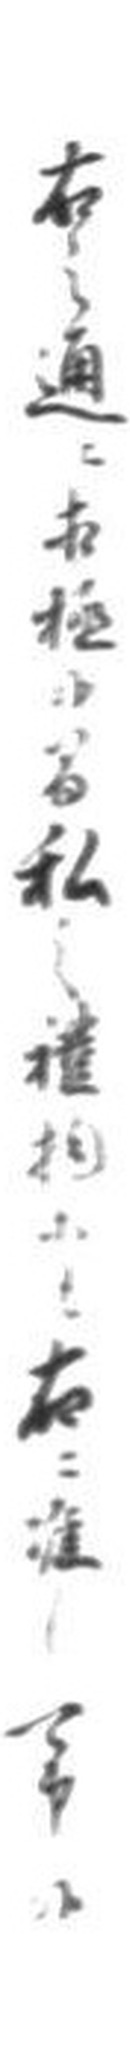右之通ニ相極候間私之礼物等も右ニ准し可申候
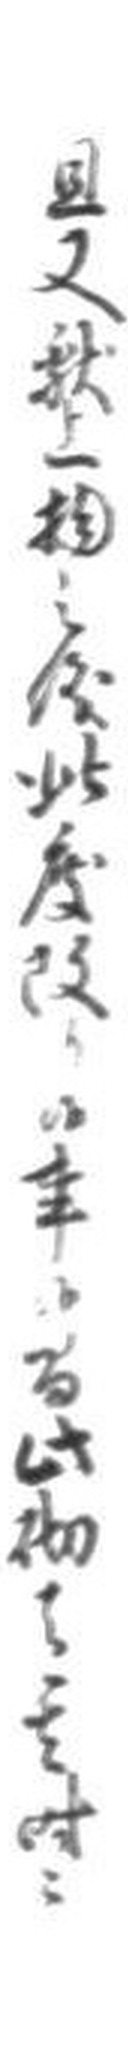且又献上物之儀此度改り候事候間此砌者其時々
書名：家譜 三十五 宗昌公 従享保六年到同七年
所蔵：福井県文書館 Fukui Prefectural Archives
